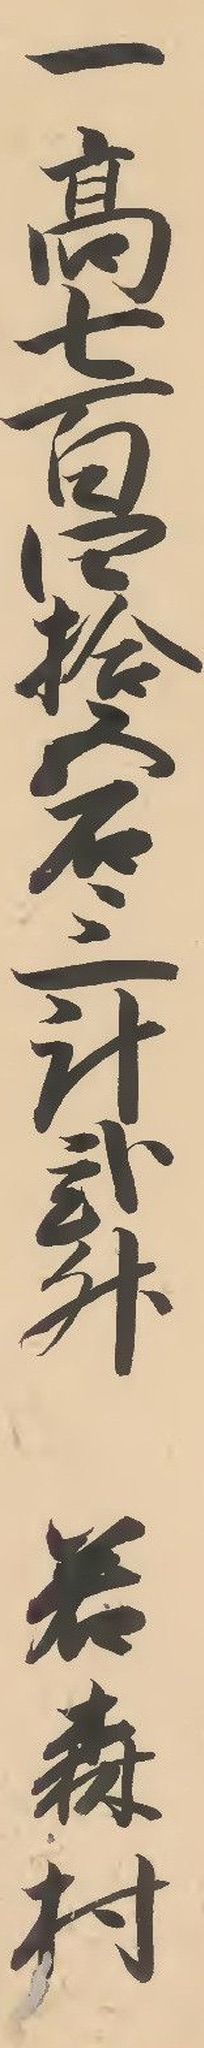一高七百四拾五石三斗弐升若森村
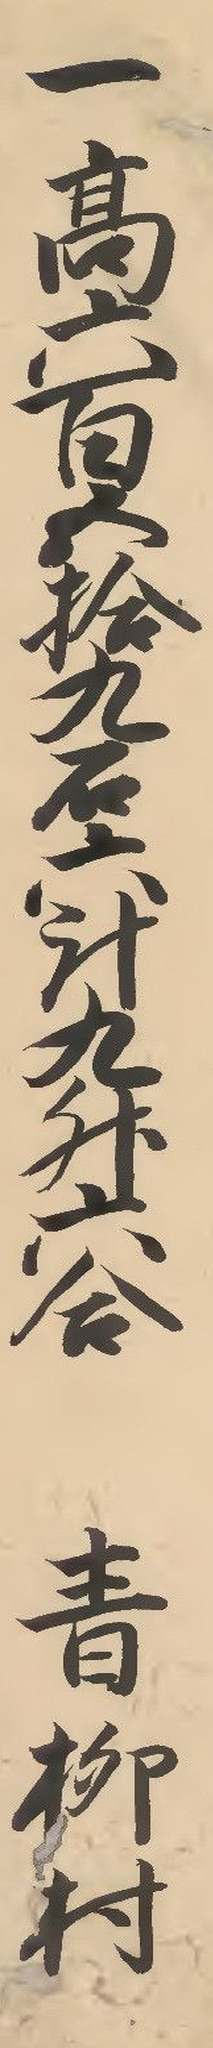一高六百五拾九石六斗九升六合青柳村

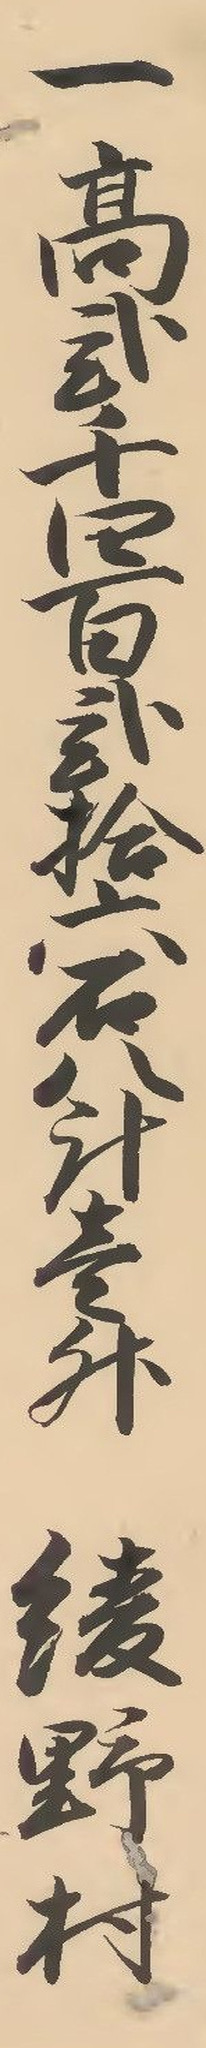一高弐千四百弐拾六石八斗壱升綾野村
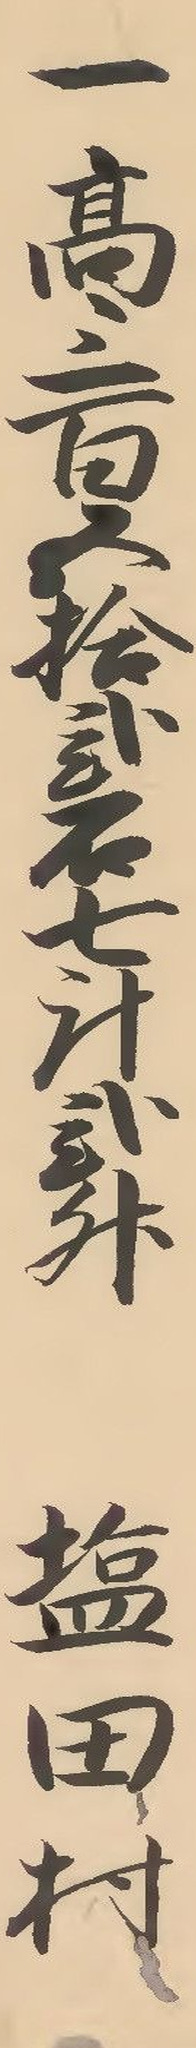一高三百五拾弐石七斗弐升塩田村
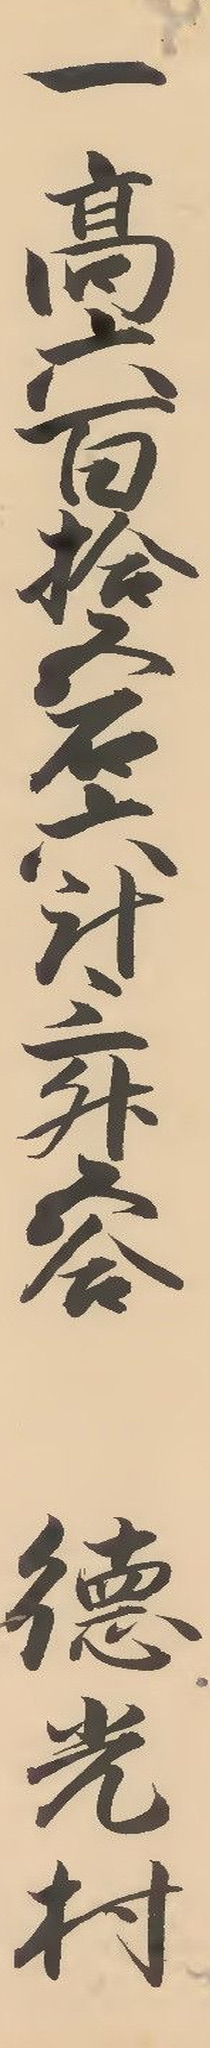一高六百拾五石六斗三升五合徳光村
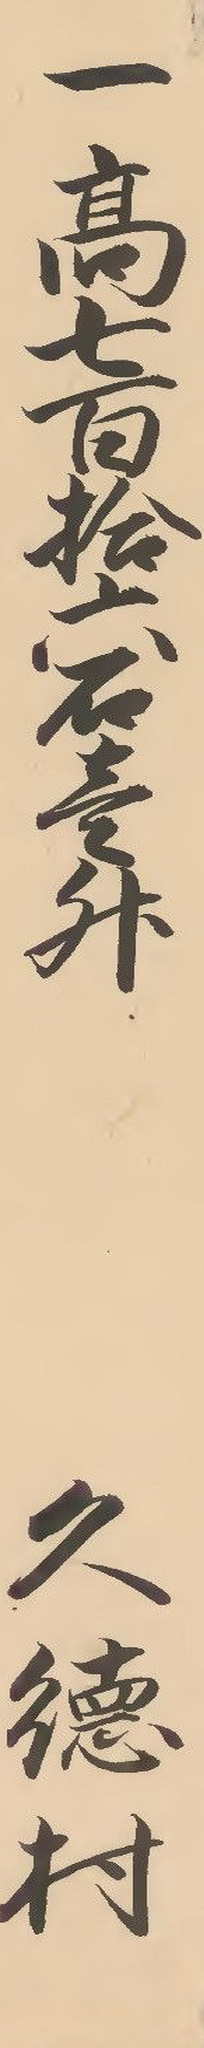一高七百拾六石壱升久徳村
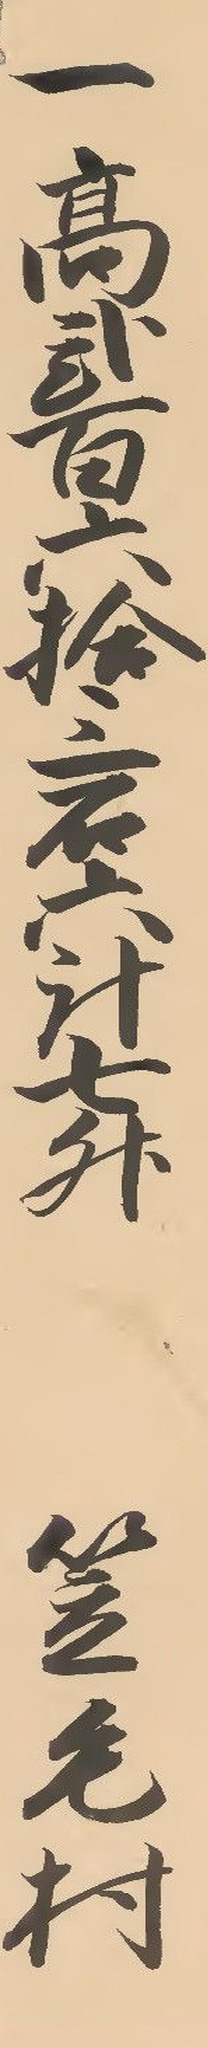一高弐百六拾三石六斗七升笠毛村
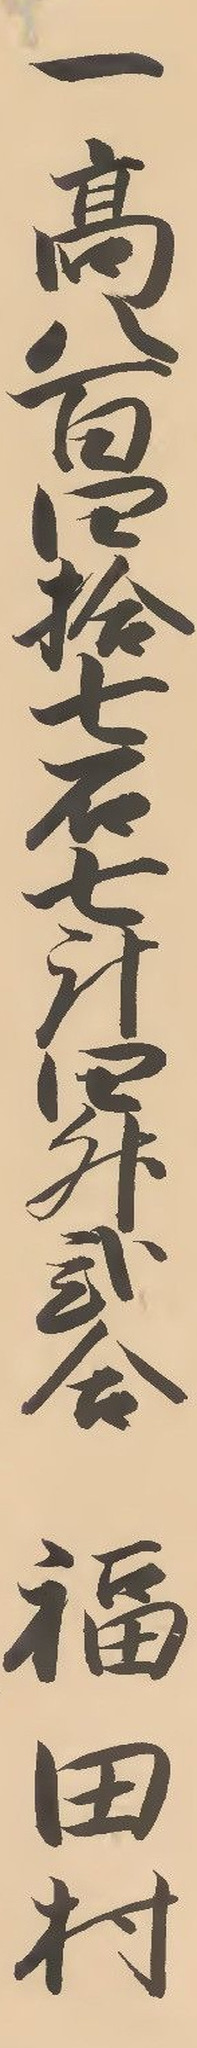一高八百四拾七石七斗四升弐合福田村
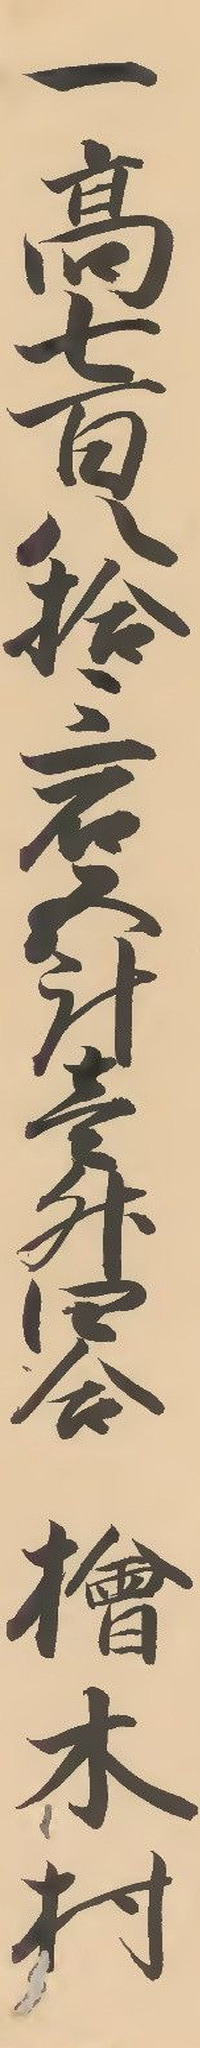一高七百八拾三石五斗壱升四合桧木村
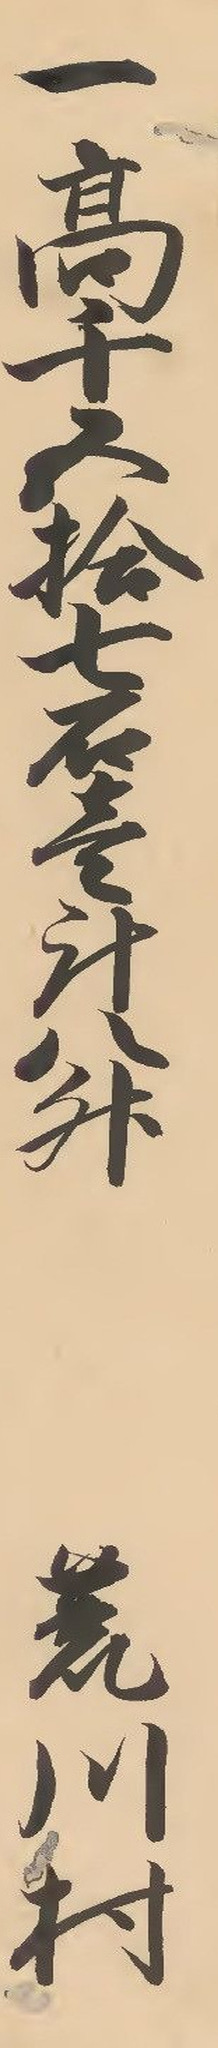一高千五拾七石壱斗八升荒川村

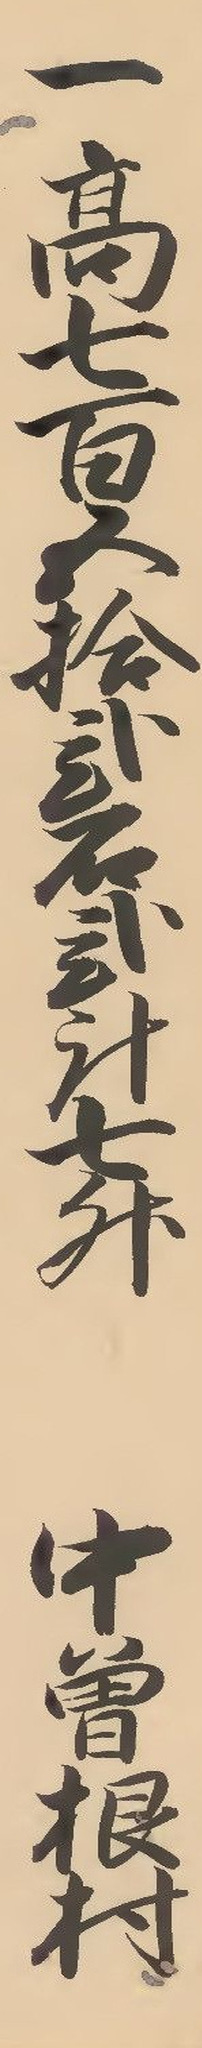一高七百五拾弐石弐斗七升中曽根村
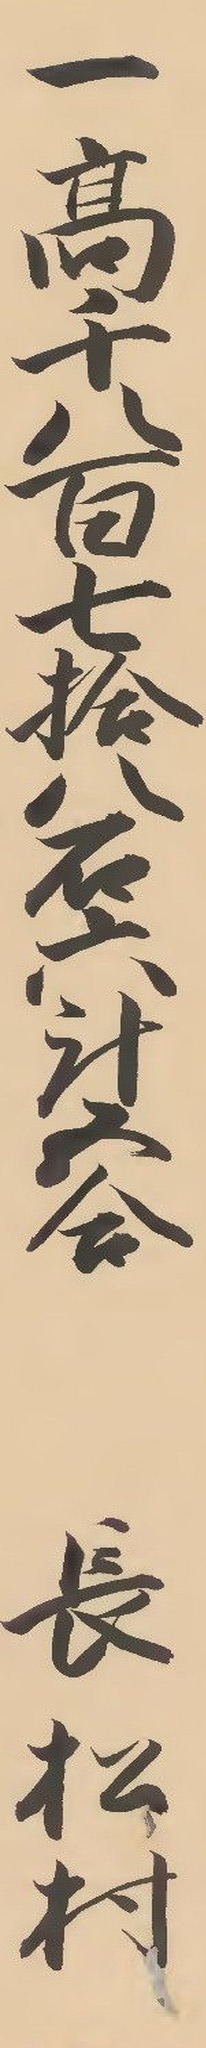一高千八百七拾八石六斗五合長松村
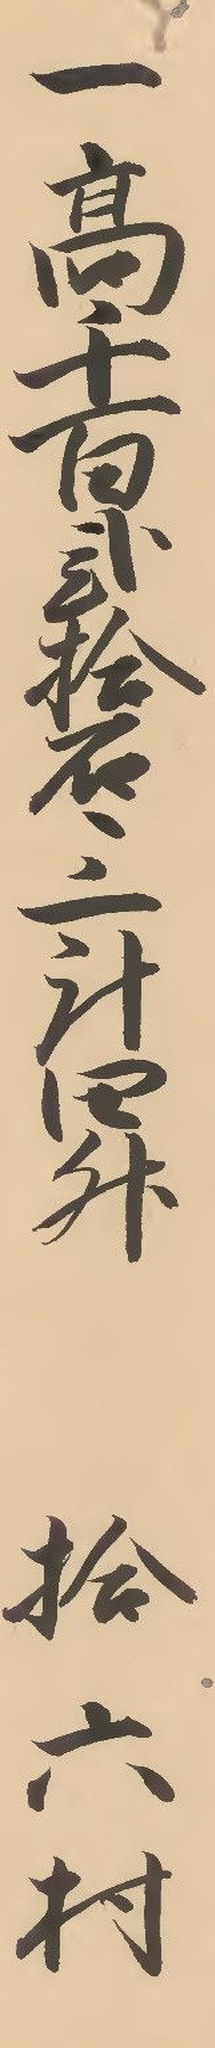一高千百弐拾石三斗四升拾六村
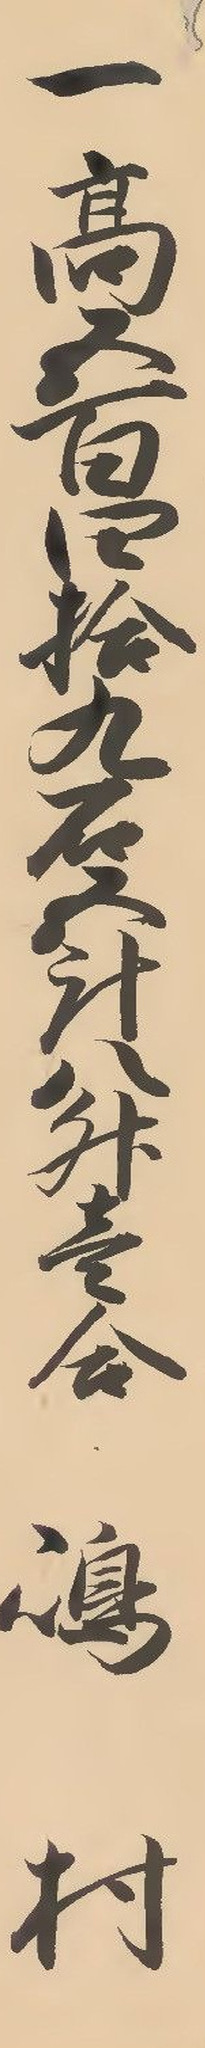一高五百四拾九石五斗八升壱合嶋村
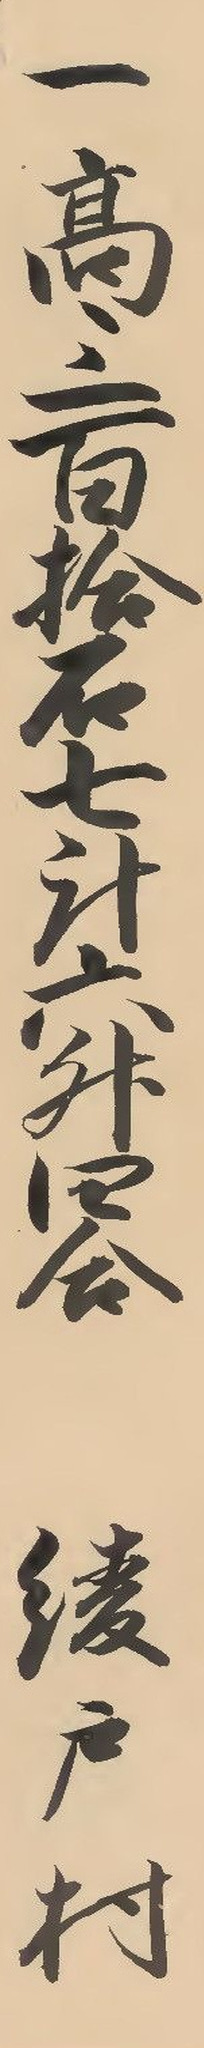一高三百拾石七斗六升四合綾戸村
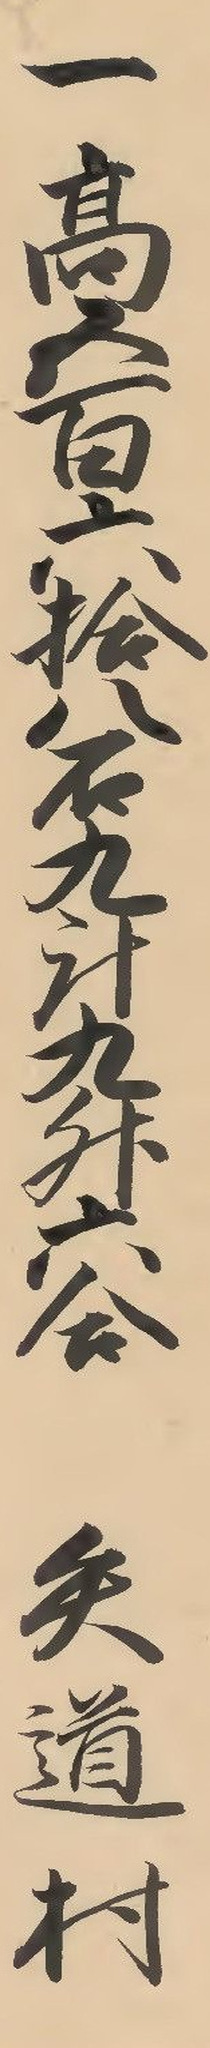一高五百六拾八石九斗九升六合矢道村
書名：美濃国郷帳
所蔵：国立公文書館 National Archives of Japan
